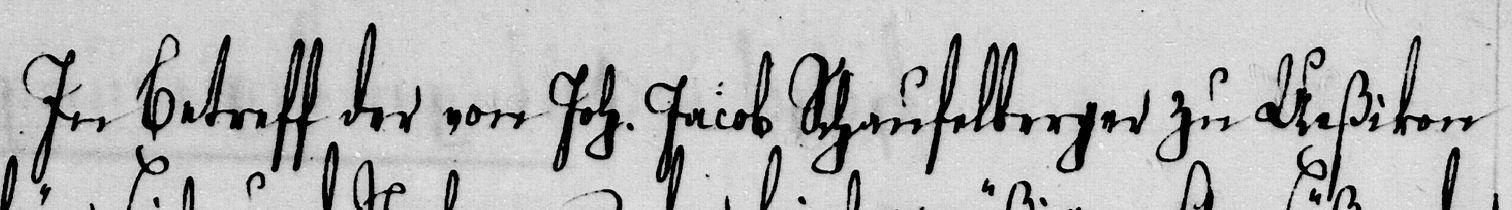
In Betreff der von Joh. Jacob Schaufelberger zu Ueßikon
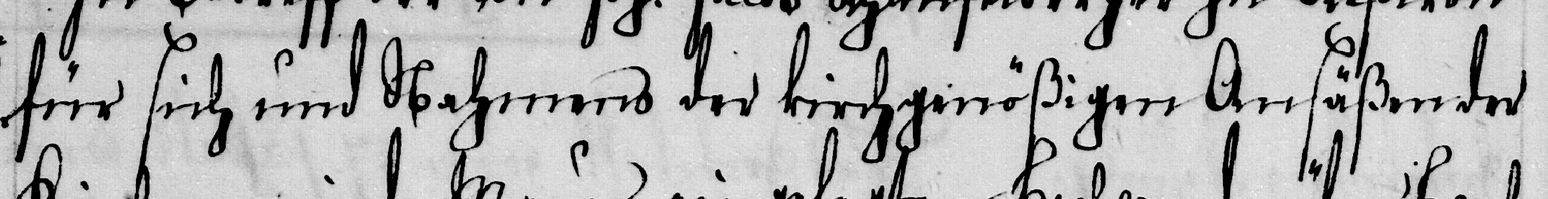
für sich und Nahmens der kirchgenößigen Ansäßen der
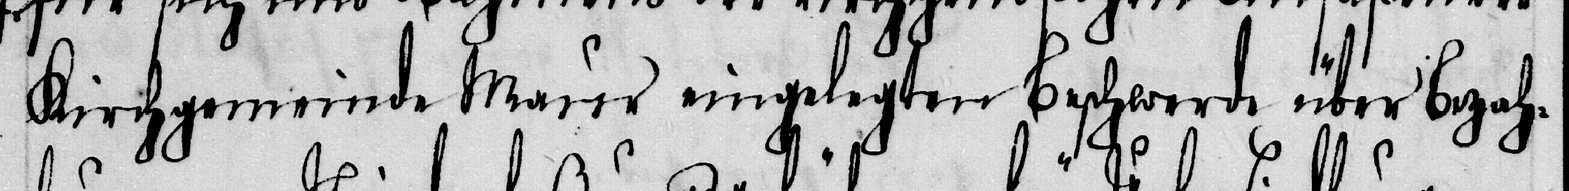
Kirchgemeinde Maur eingelegten Beschwerde über Bezah¬
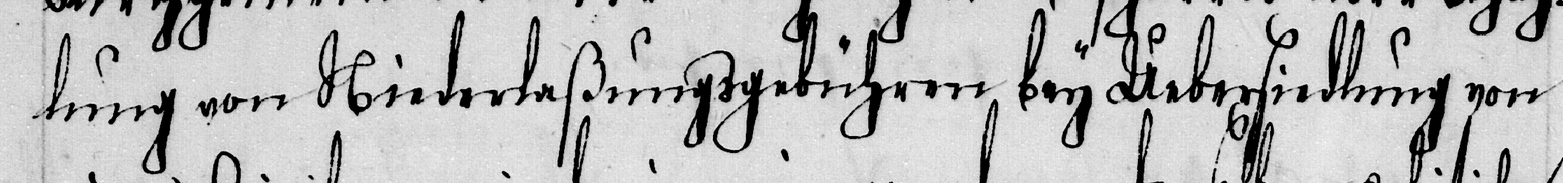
lung von Niederlaßungsgebühren bey Uebersiedlung von
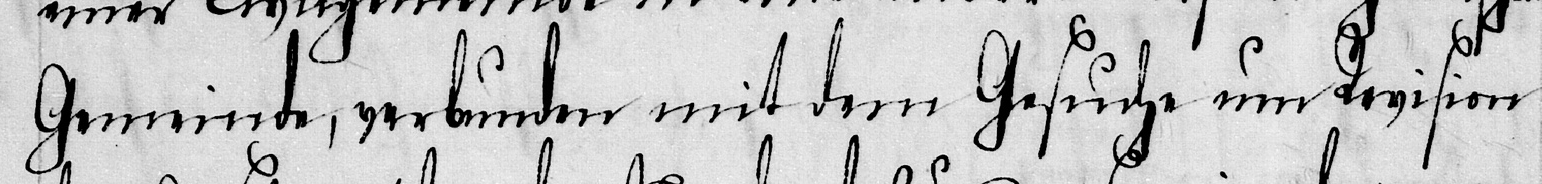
Gemeinde, verbunden mit dem Gesuche um Revision
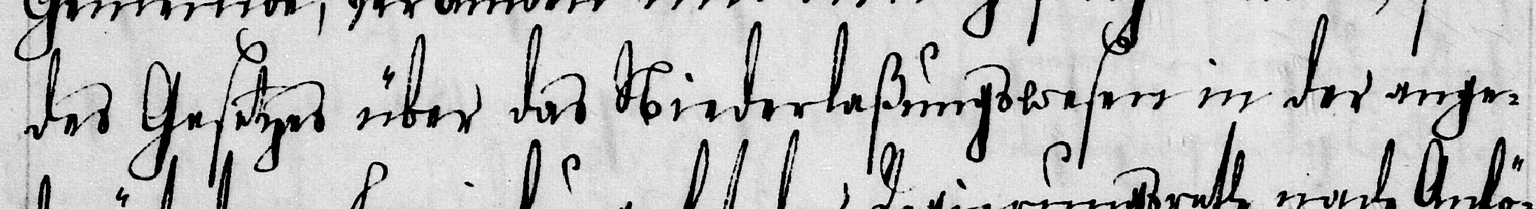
des Gesetzes über das Niederlaßungswesen in der ange¬
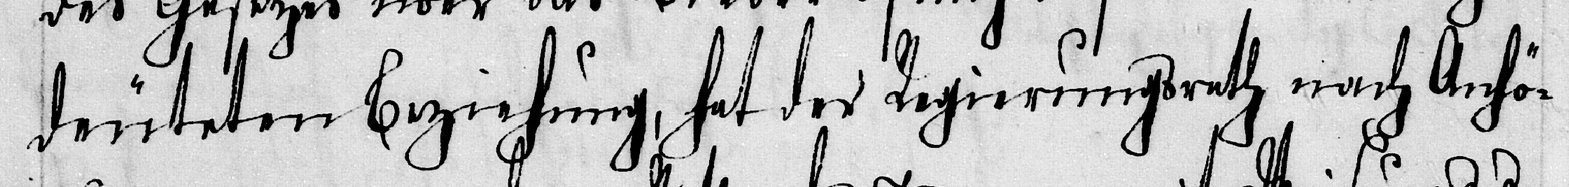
deuteten Beziehung, hat der Regierungsrath nach Anhö¬
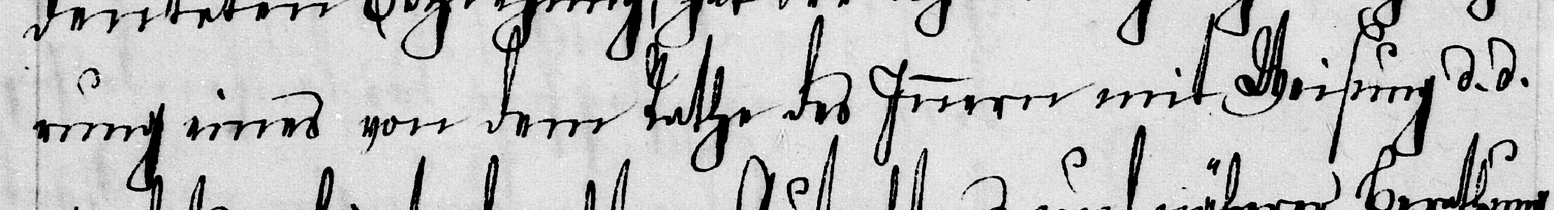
rung eines von dem Rathe des Innern mit Weisung d. d.
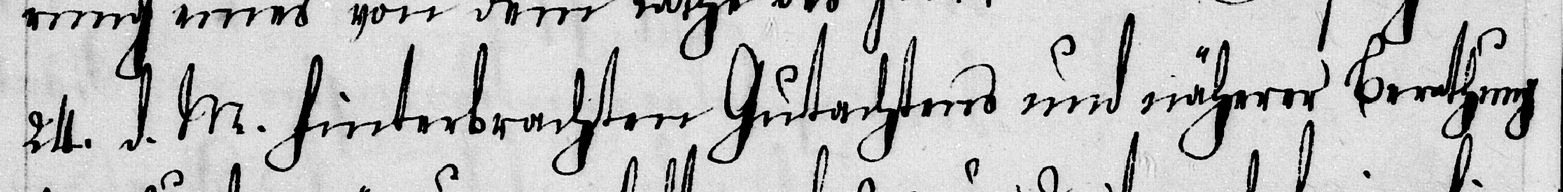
24. d. M. hinterbrachten Gutachtens und näherer Berathung
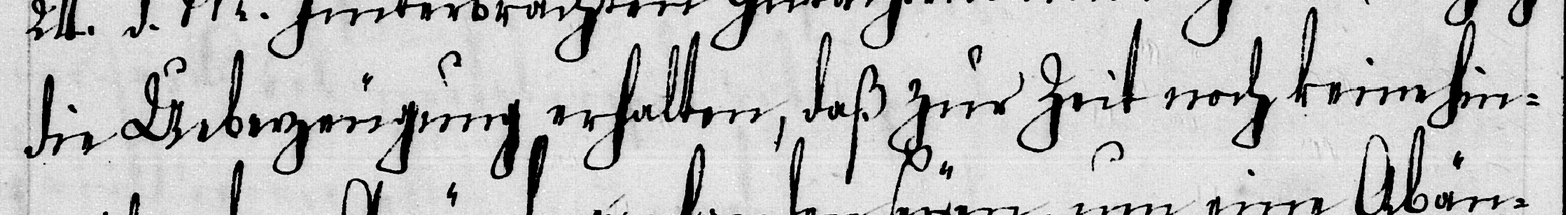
die Ueberzeugung erhalten, daß zur Zeit noch keine hin¬
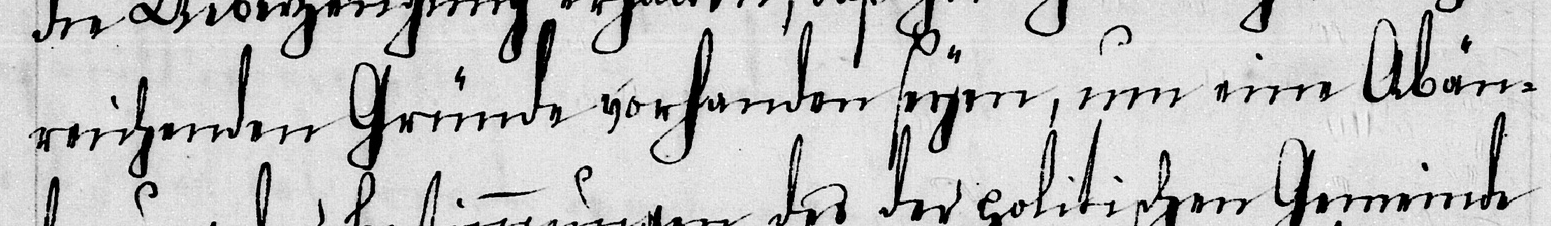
reichenden Gründe vorhanden seyen, um eine Abän¬
